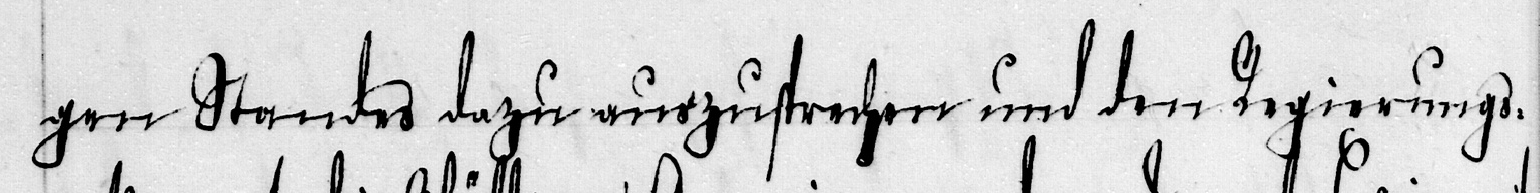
igen Standes dazu auszusprechen und den Regierungs¬
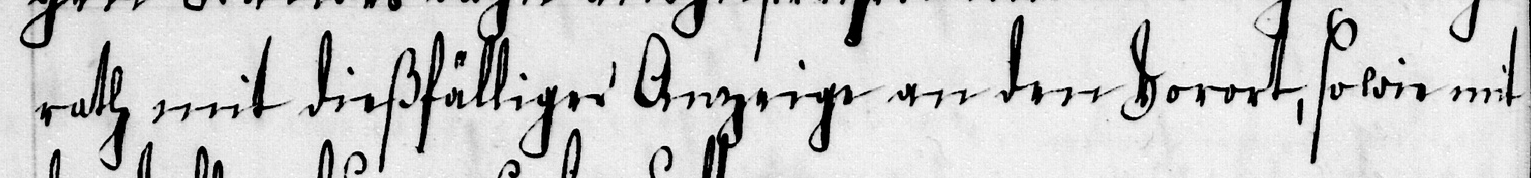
rath mit dießfälliger Anzeige an den Vorort, sowie mit
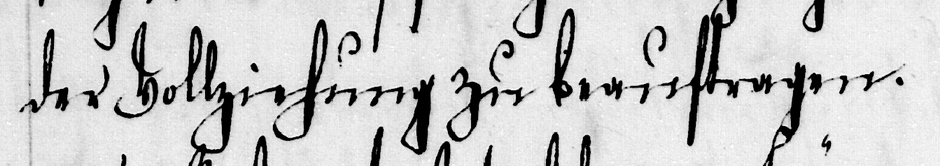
der Vollziehung zu beauftragen.
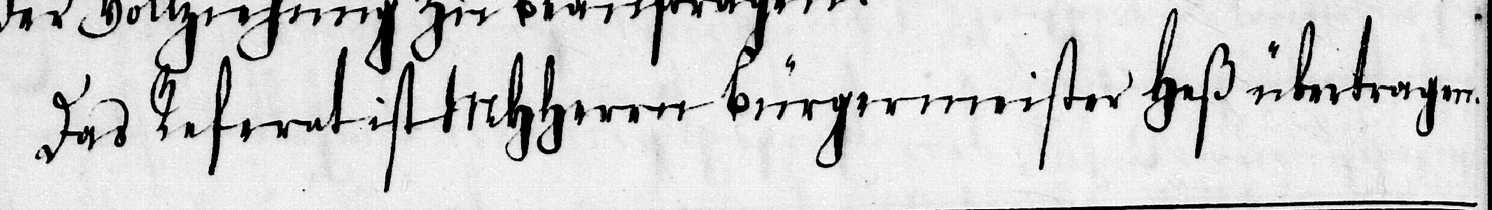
Das Referat ist MHHerrn Bürgermeister Heß übertragen.
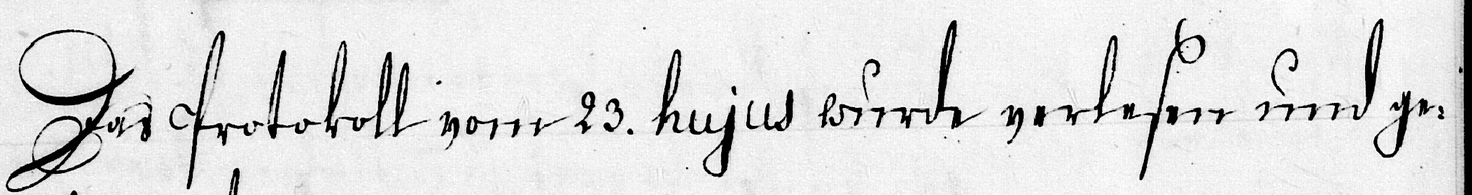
Das Protokoll vom 23. hujus wurde verlesen und ge¬
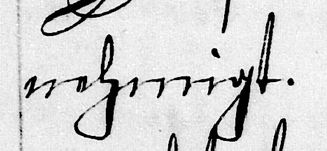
nehmigt.
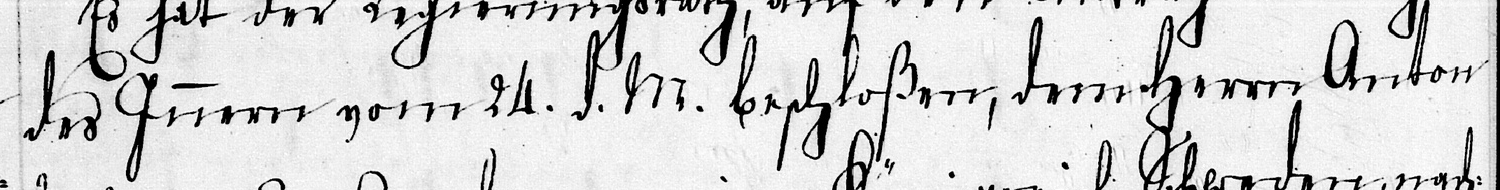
des Innern vom 24. d. M. beschloßen, dem Herrn Anton
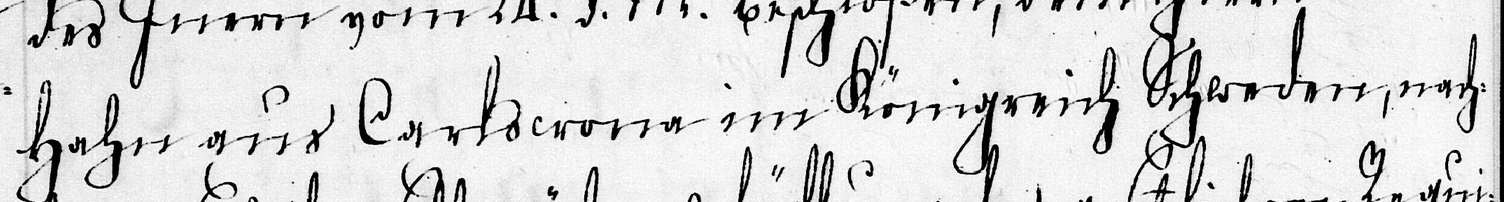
Hahn aus Carlscrona im Königreich Schweden, nach¬
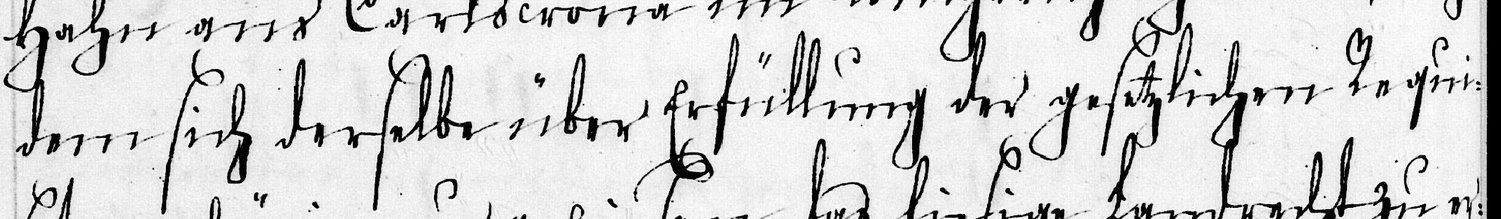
dem sich derselbe über Erfüllung der gesetzlichen Requ¬
